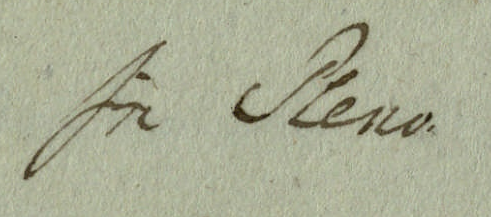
In Pleno
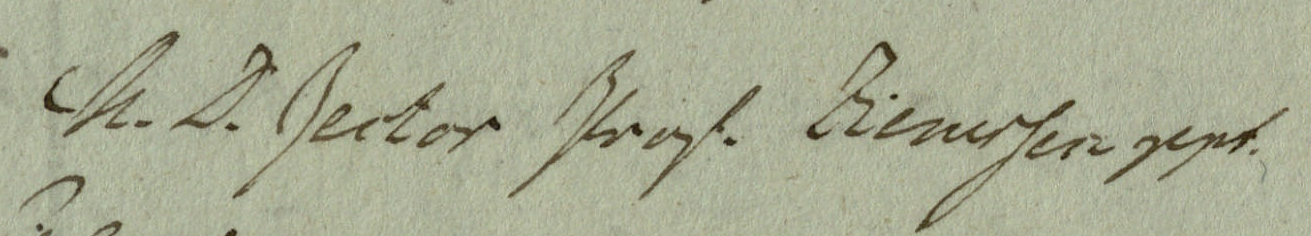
M. D. Rector Prof. Ziemssen ppt.
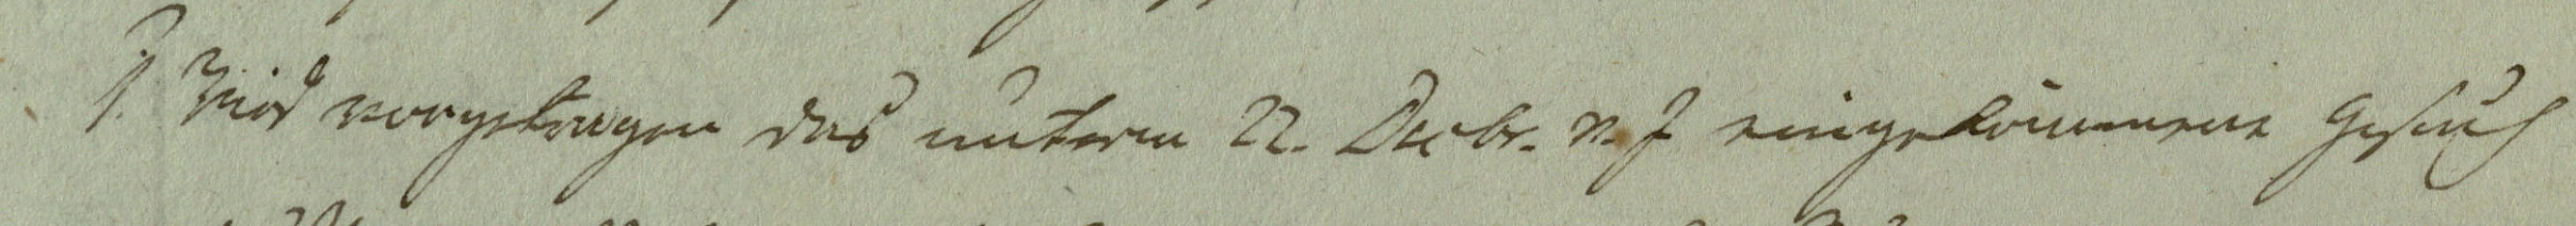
1. Wird vorgetragen das unterm 22. Decbr. v. J. eingekommene Gesuch
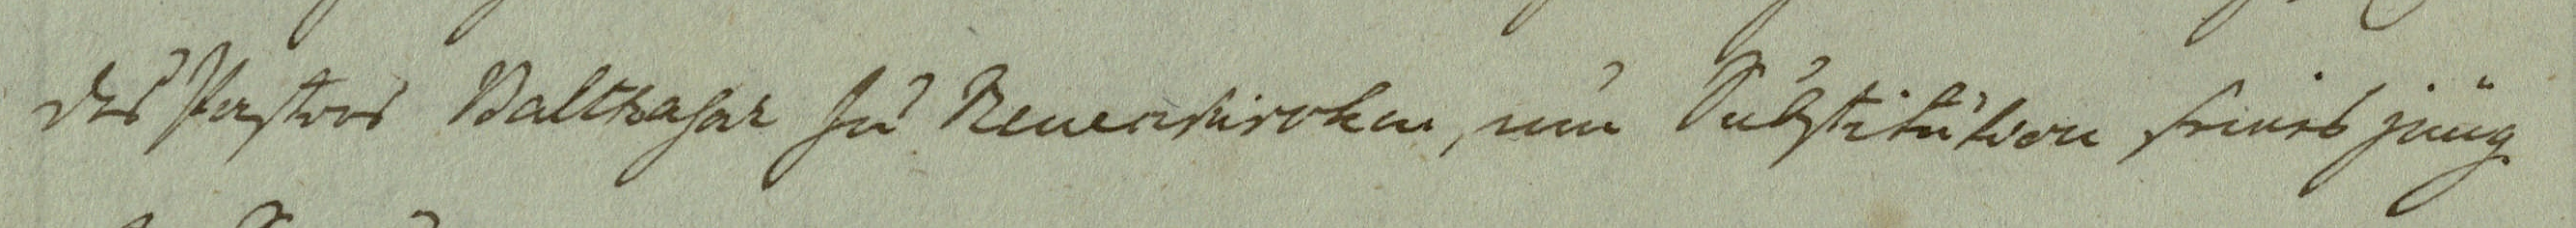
des Pastors Balthasar zu Neuenkirchen, um Substitution seines jüng¬
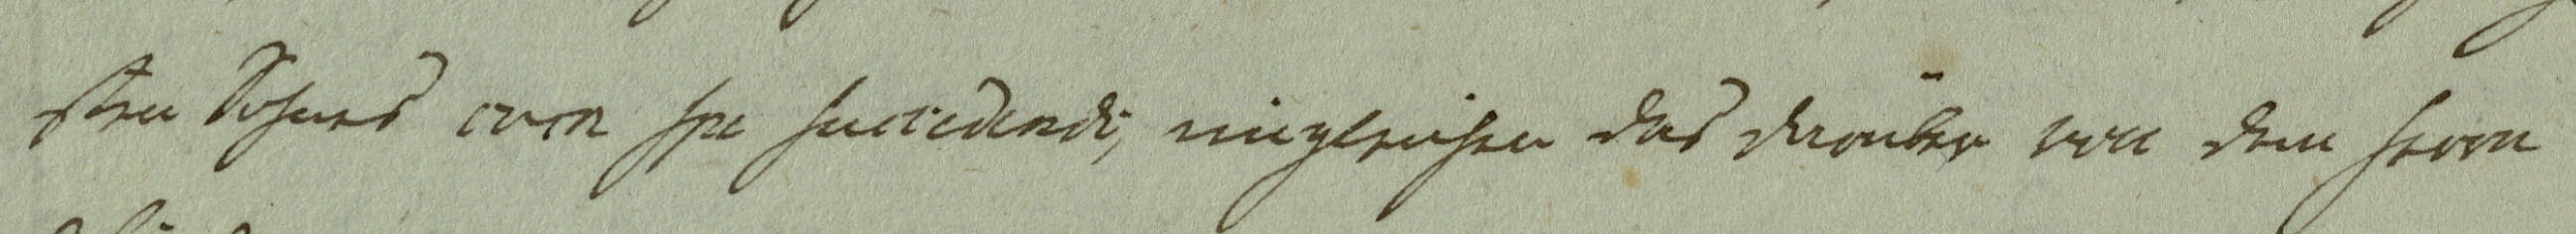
sten Sohnes cum spe succedendi, imgleichen das darüber von dem Herrn
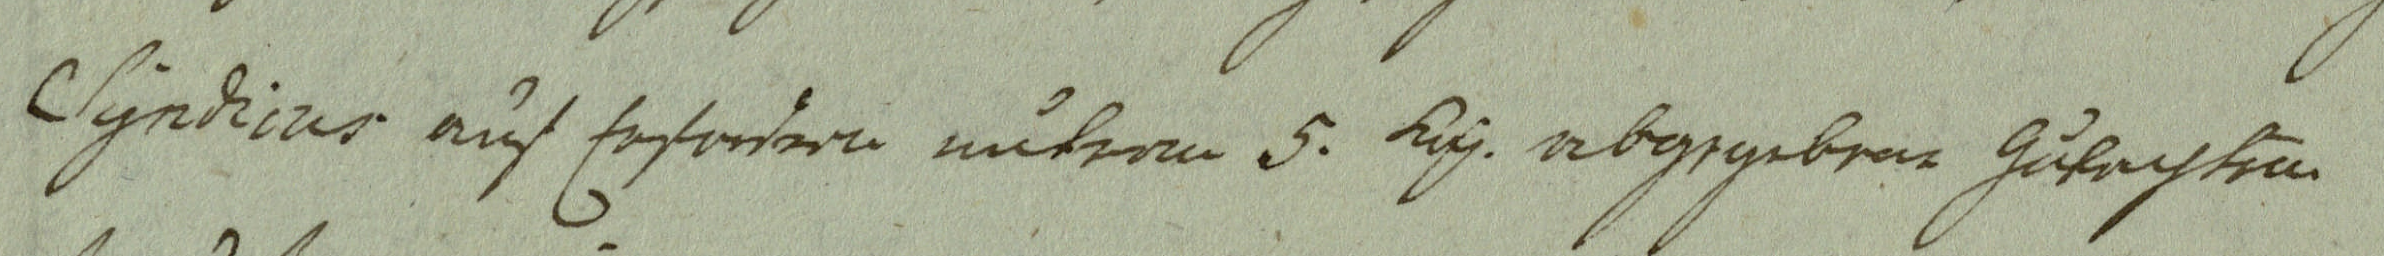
Sÿndicus auf Erfordern unterm 5. huj. abgegebene Gutachten.
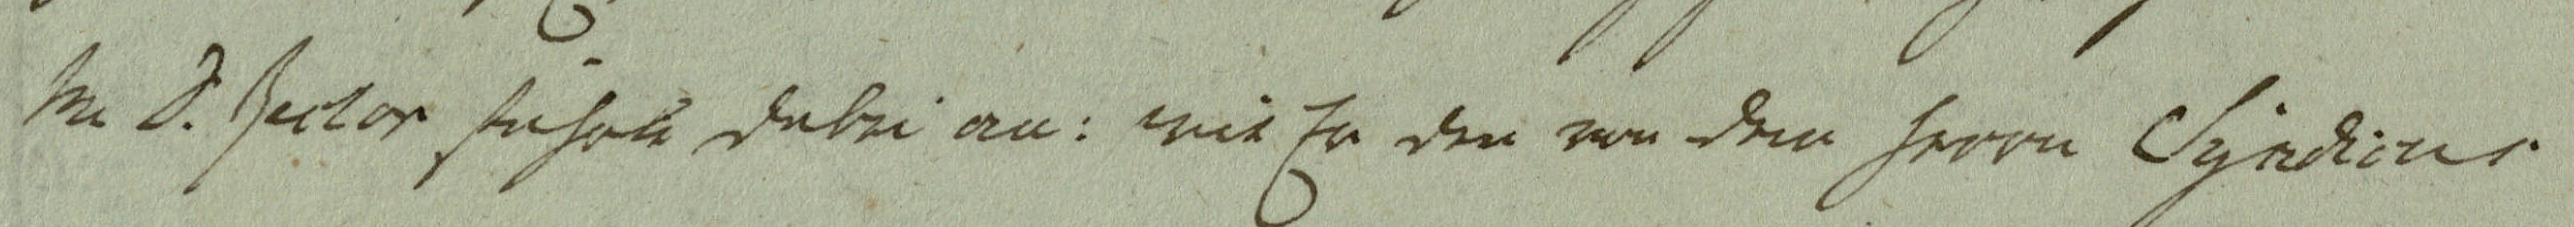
M. D. Rector führte dabei an: wie Er den von dem Herrn Sÿndicus
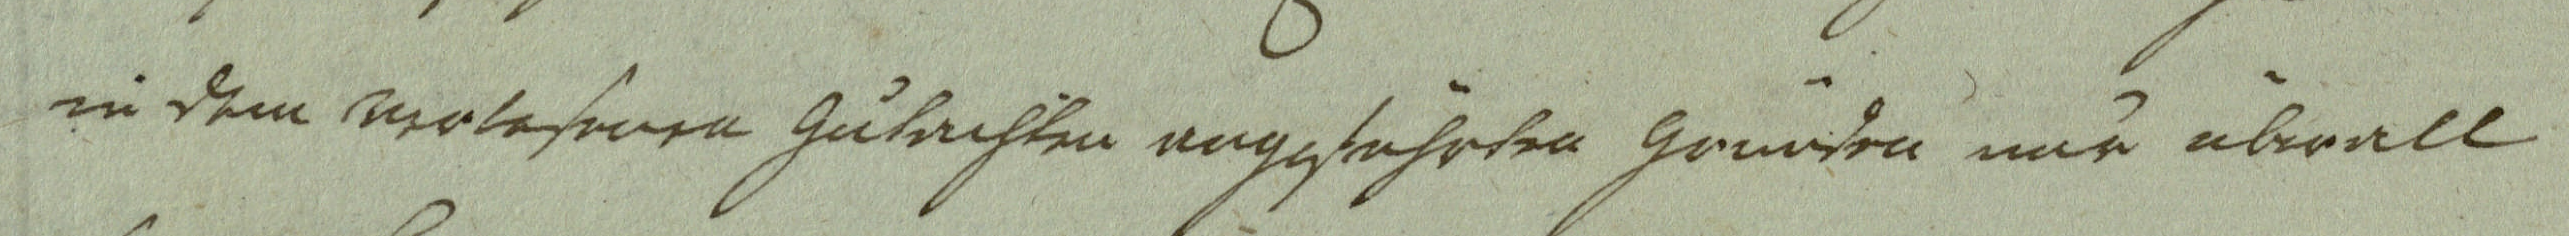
in dem verlesenen Gutachten angeführten Gründen nur überall
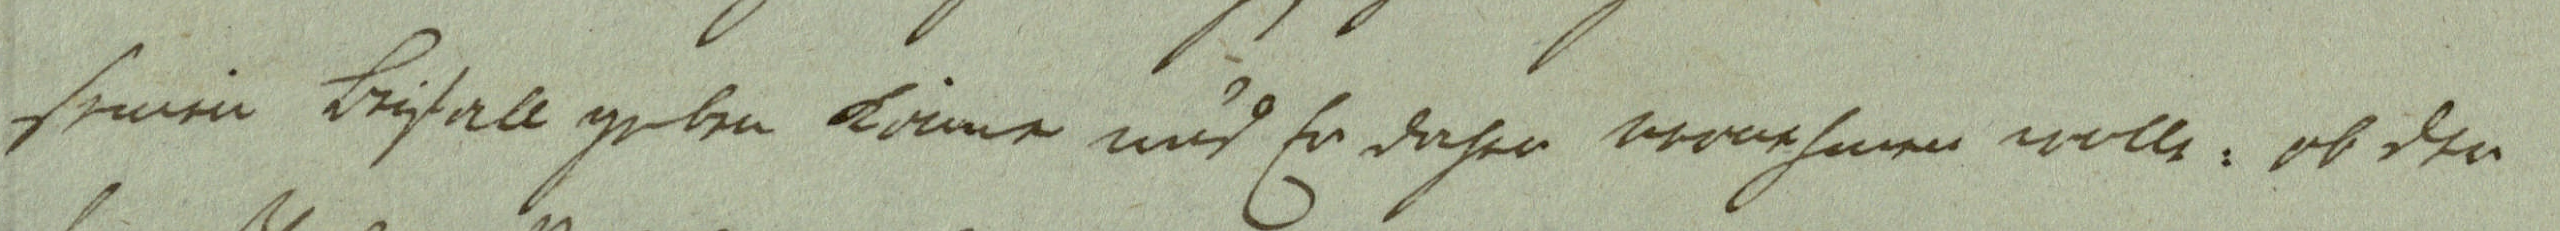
seinen Beifall geben könne und Er daher vernehmen wolle: ob der
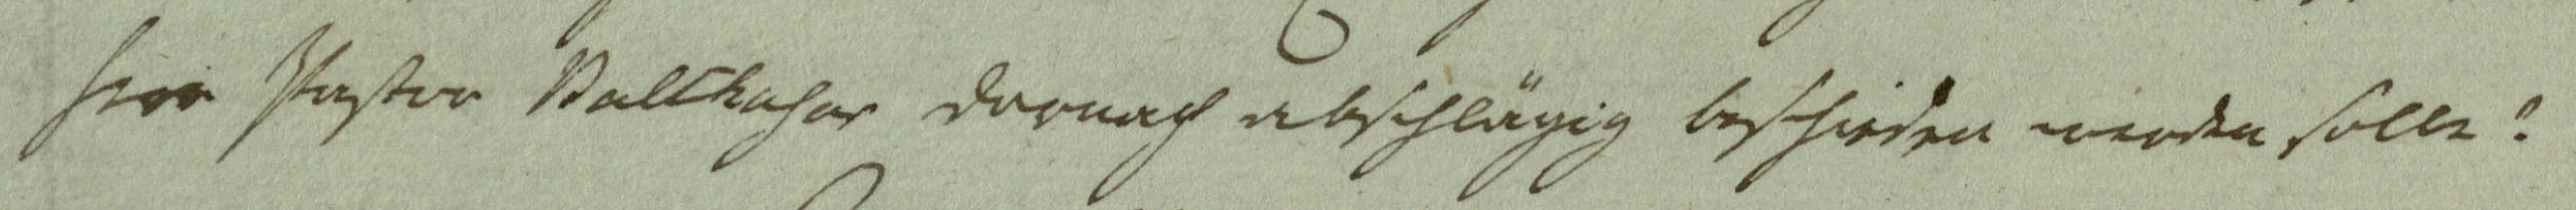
Herr Pastor Balthasar darnach abschlägig beschieden werden solle?
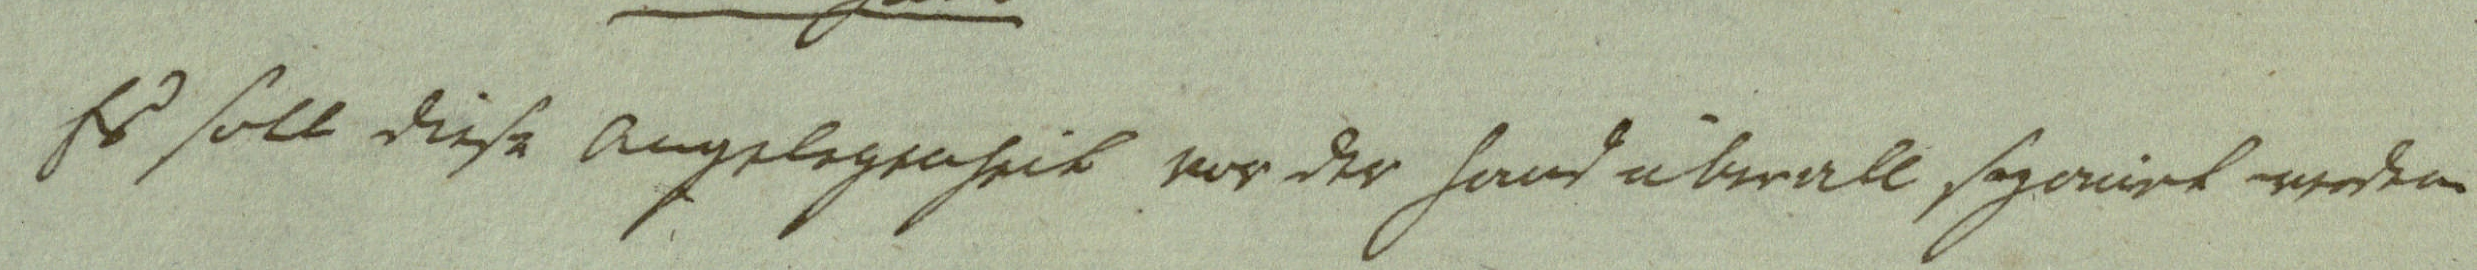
Es soll diese Angelegenheit vor der Hand überall seponirt werden.
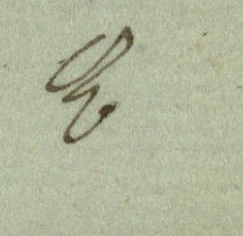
dh.
